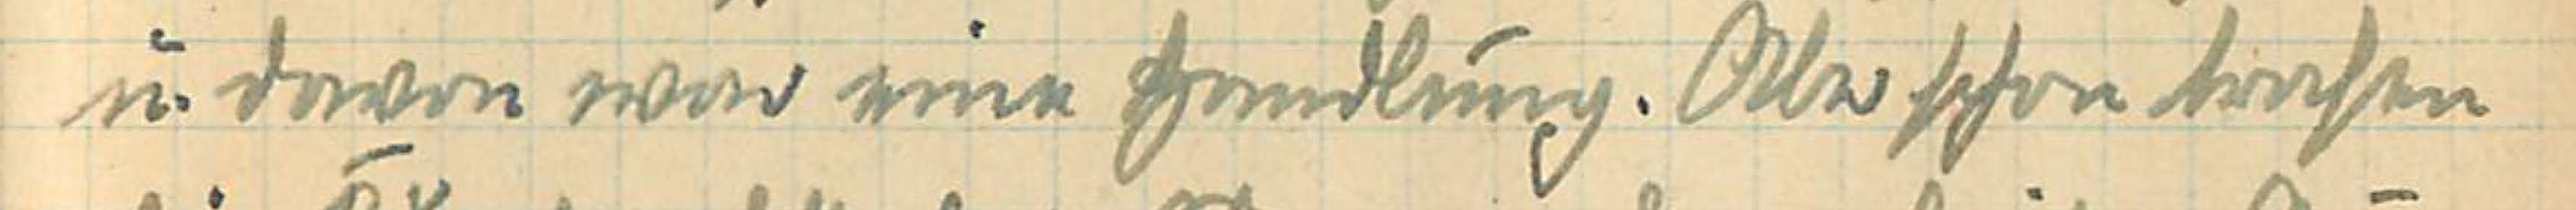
u. davon war eine Handlung. Aber schon trafen
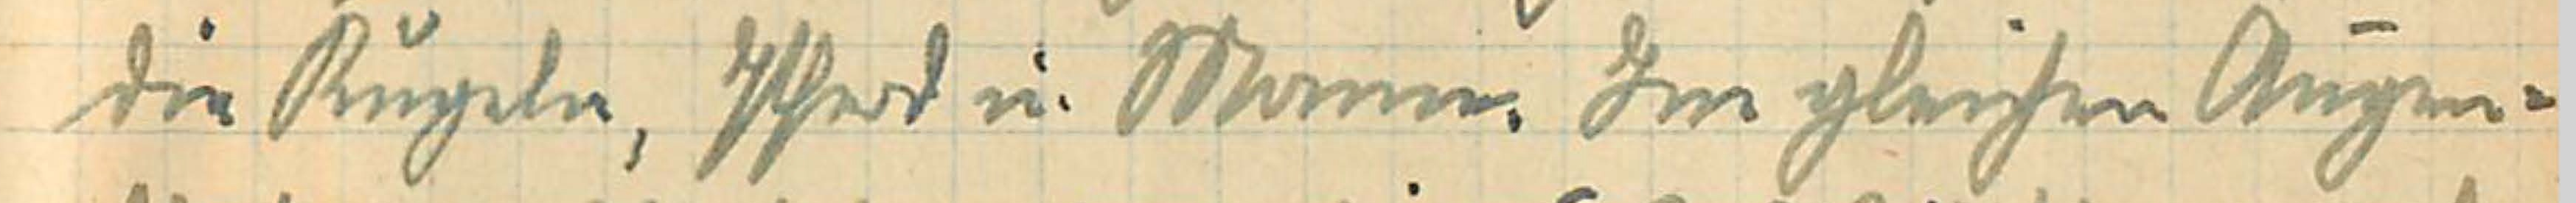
die Kugeln, Pferd u. Mann. Im gleichen Augen-
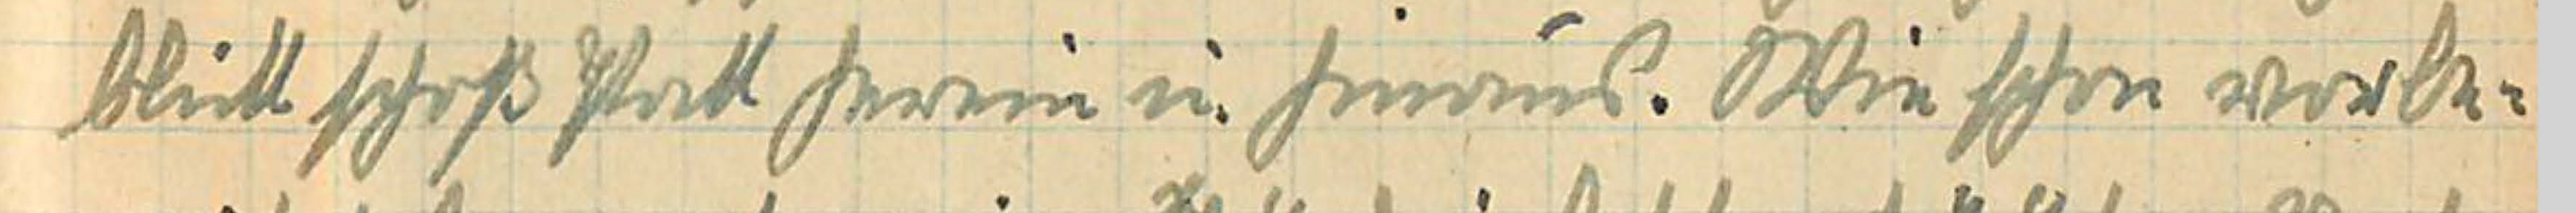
blick schoß Pak herein u. hinaus. Wie schon vorbe-
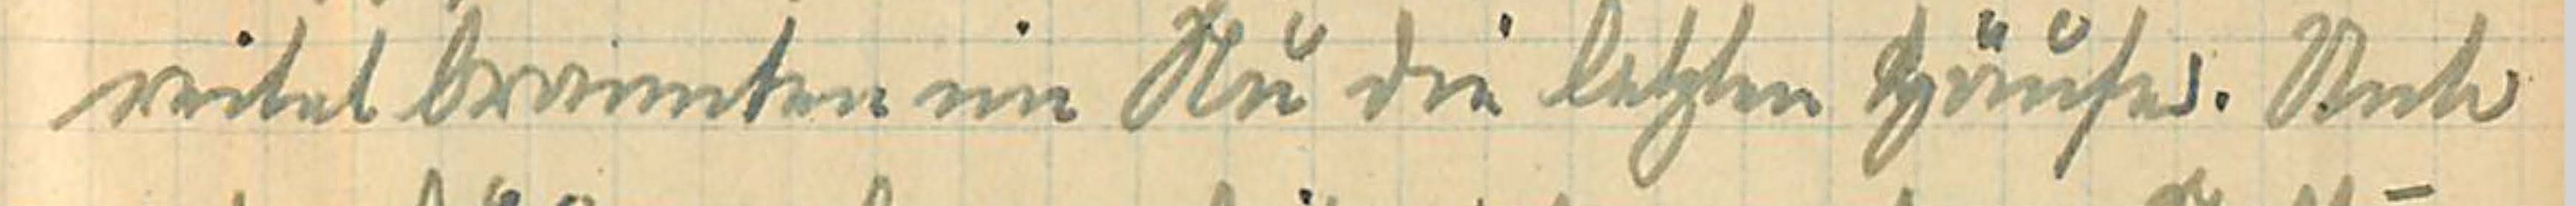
reitet brannten im Nu die letzten Häuser. Unter
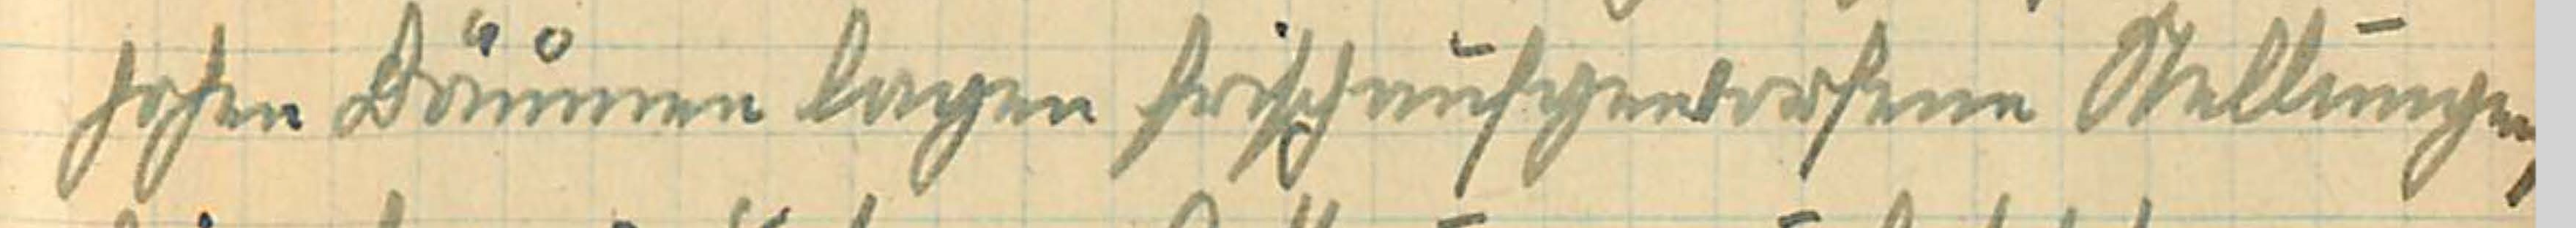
hohen Bäumen lagen frischaufgeworfene Stellungen,
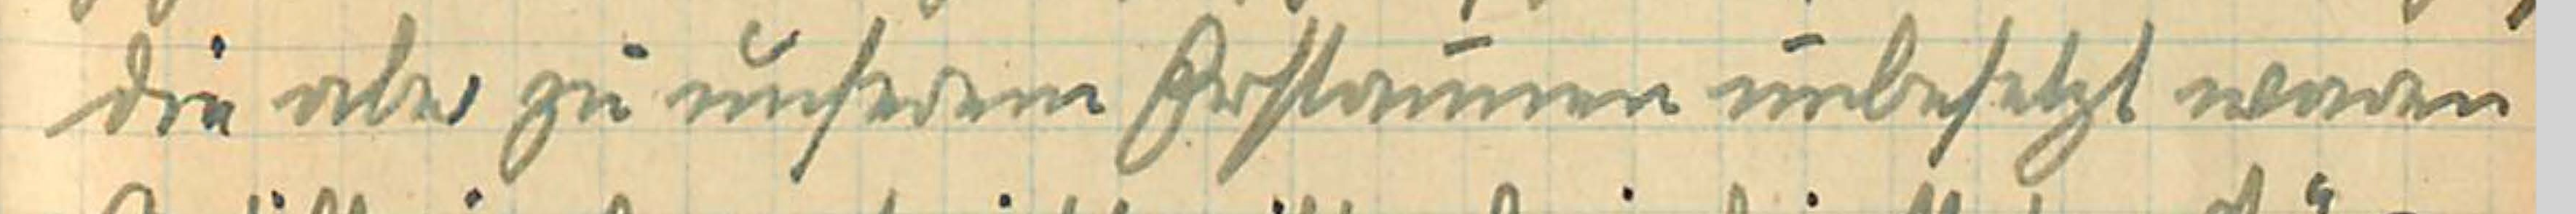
die aber zu unserem Erstaunen unbesetzt waren.
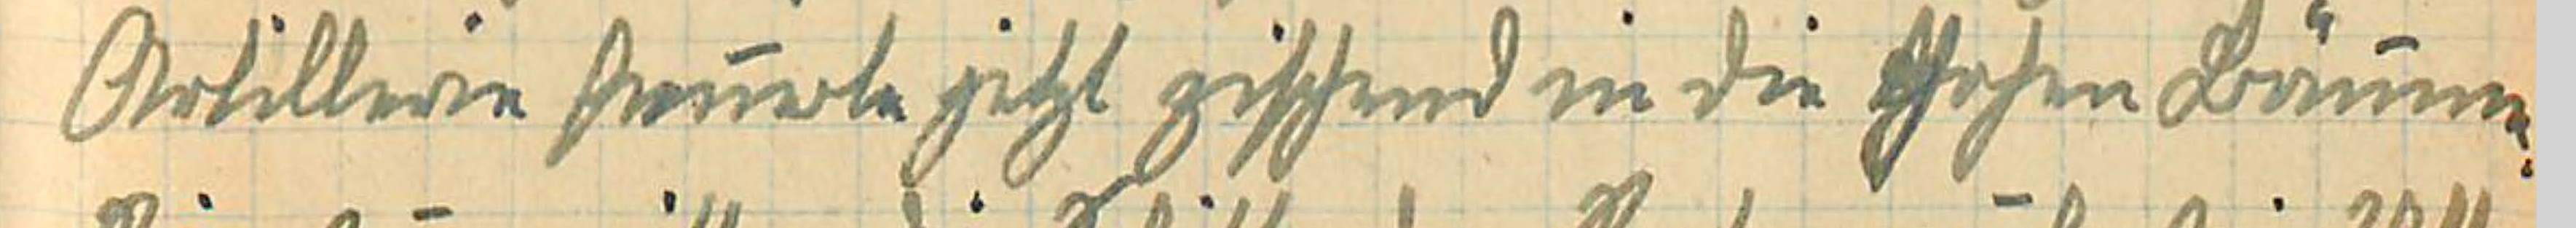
Artillerie feuerte jetzt zischend in die hohen Bäume.
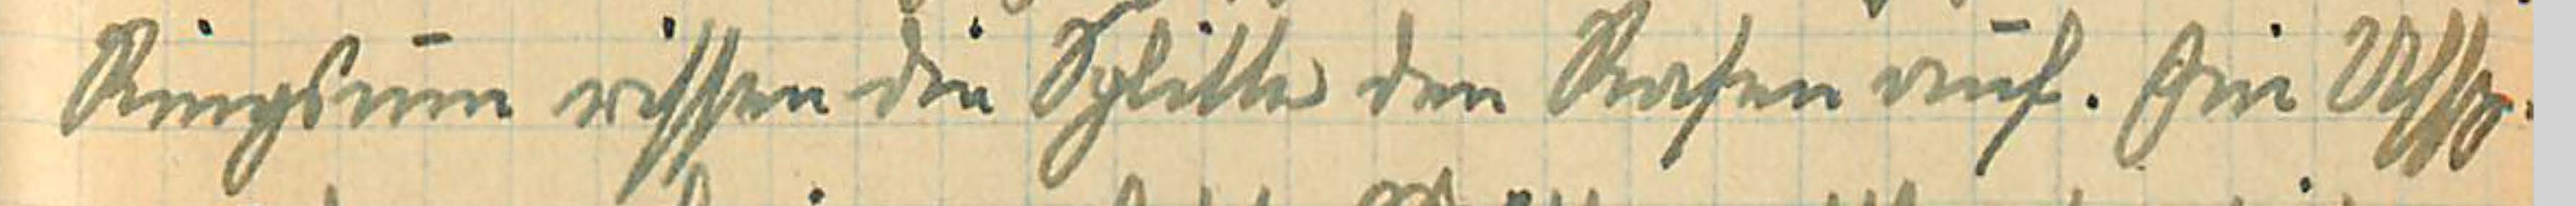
Ringsum rissen die Splitter den Rasen auf. Ein Uffz.
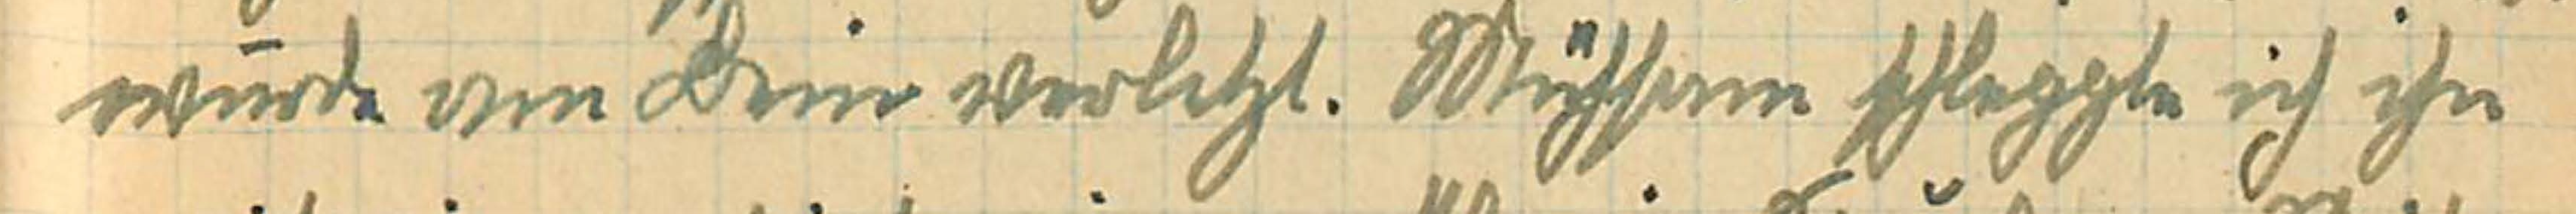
wurde am Bein verletzt. Mühsam schleppte ich ihn
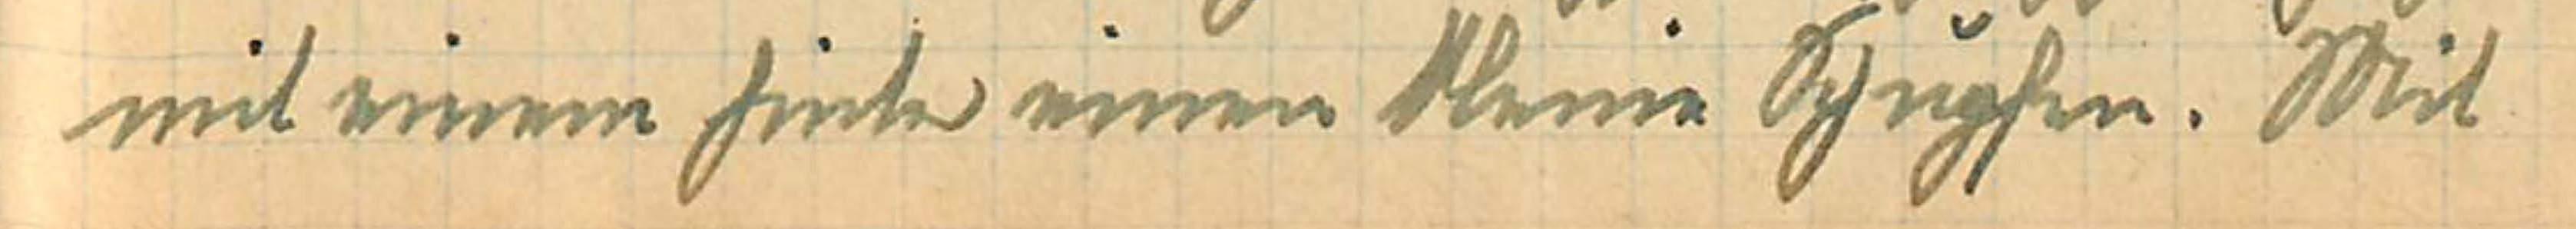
mit einem hinter einen kleine Schupfen. Mit
